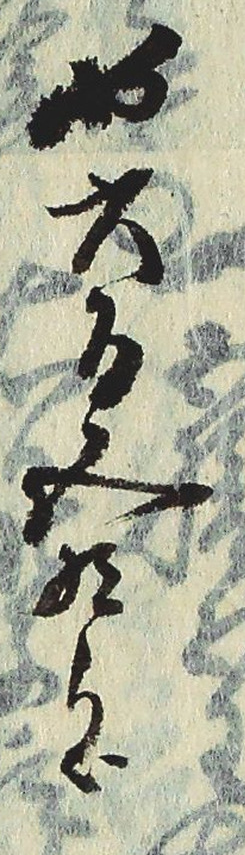〆六百五拾匁
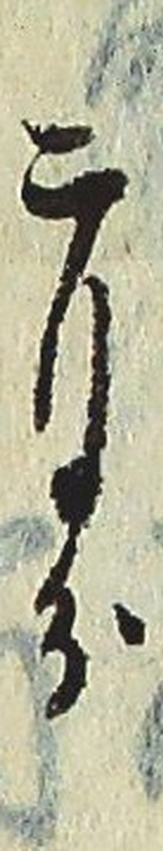二月分
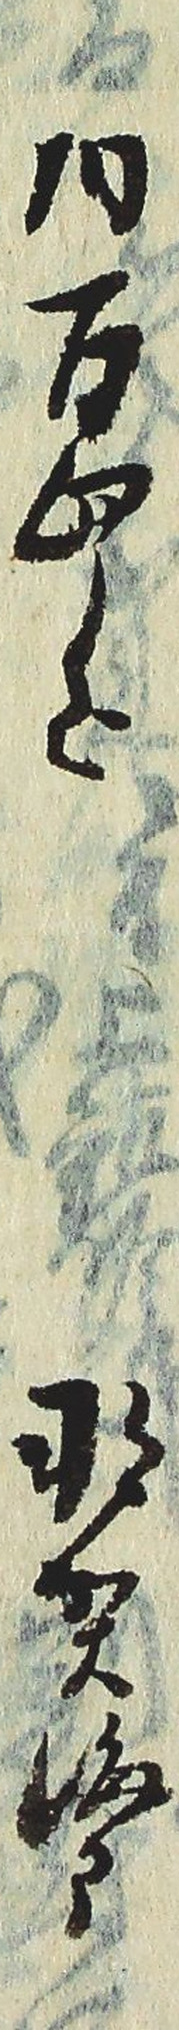内百四匁那賀海部
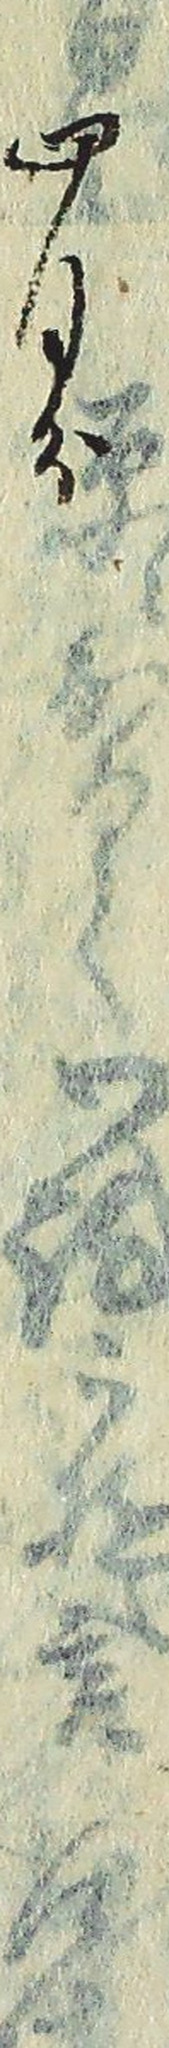四月分
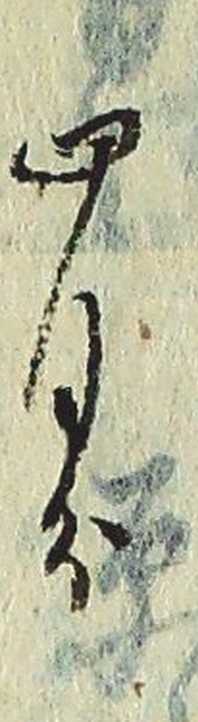四月分
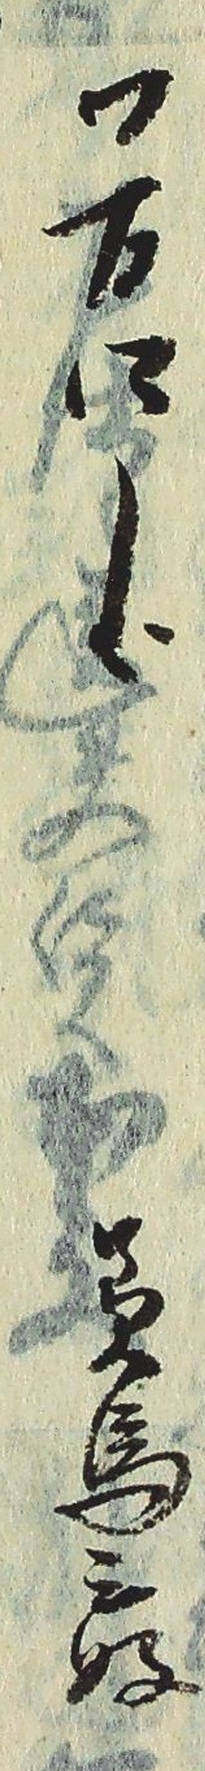同百四匁美馬三好
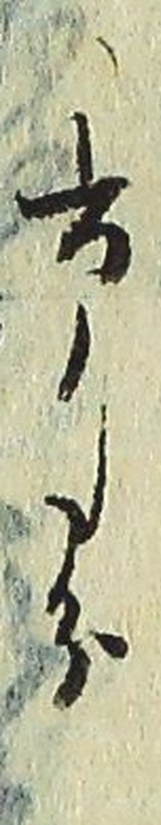六月分
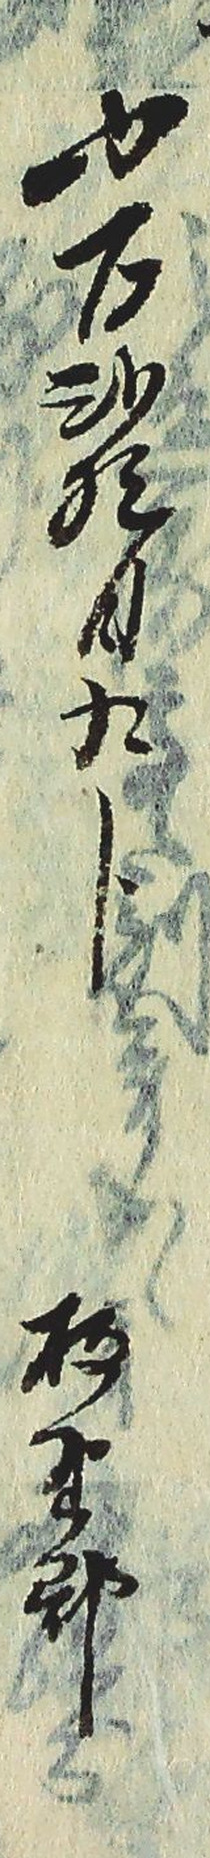内百弐拾目九分枝野郡
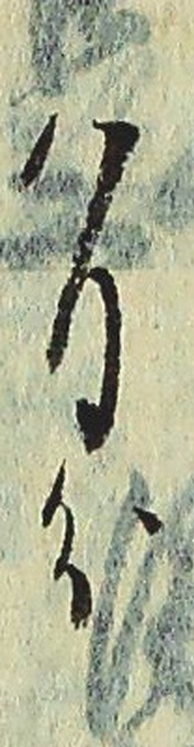八月分
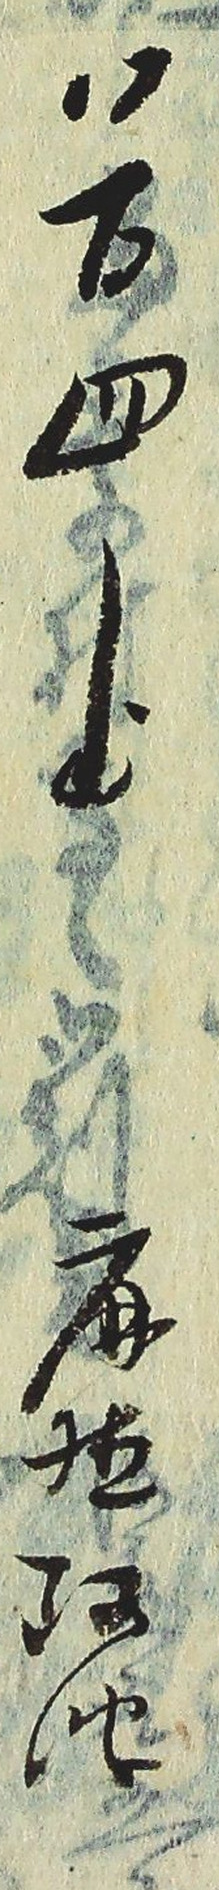同百四匁麻植阿波
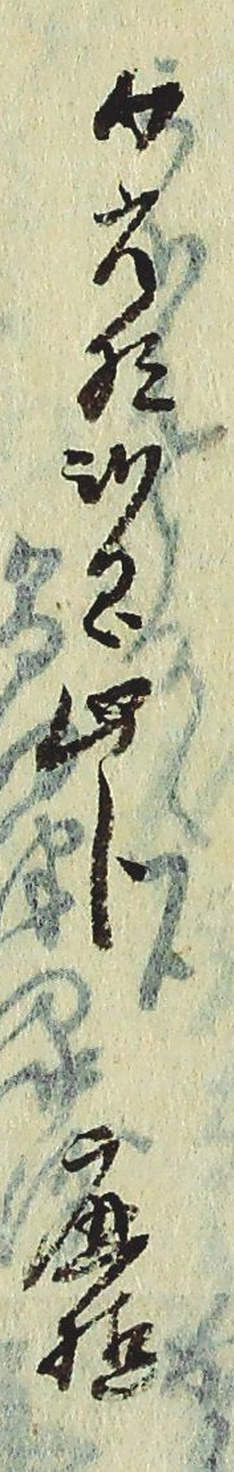内六拾弐匁四分麻植
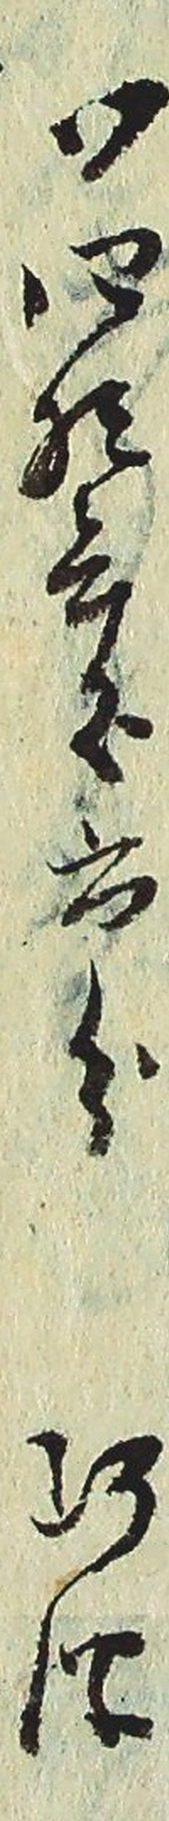同四拾壱匁六分阿波
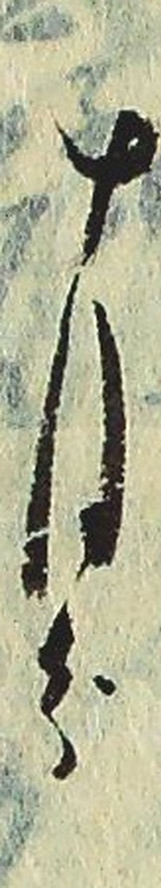十月分
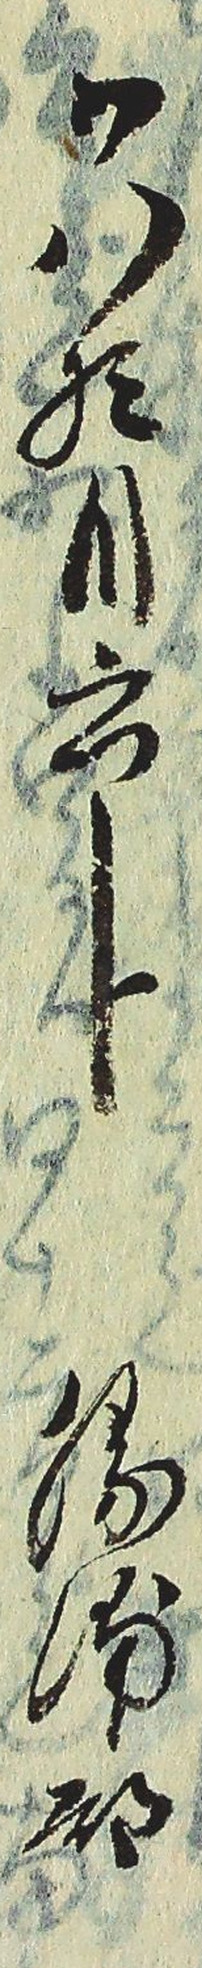同八拾目六分勝浦郡
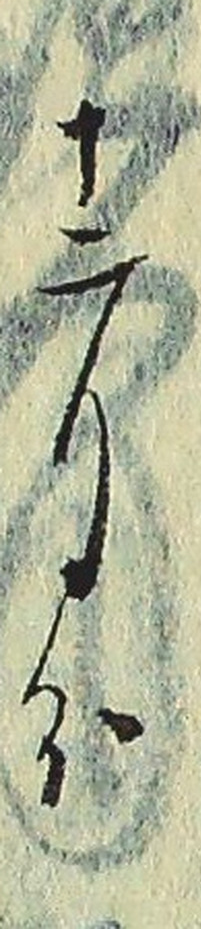十二月分
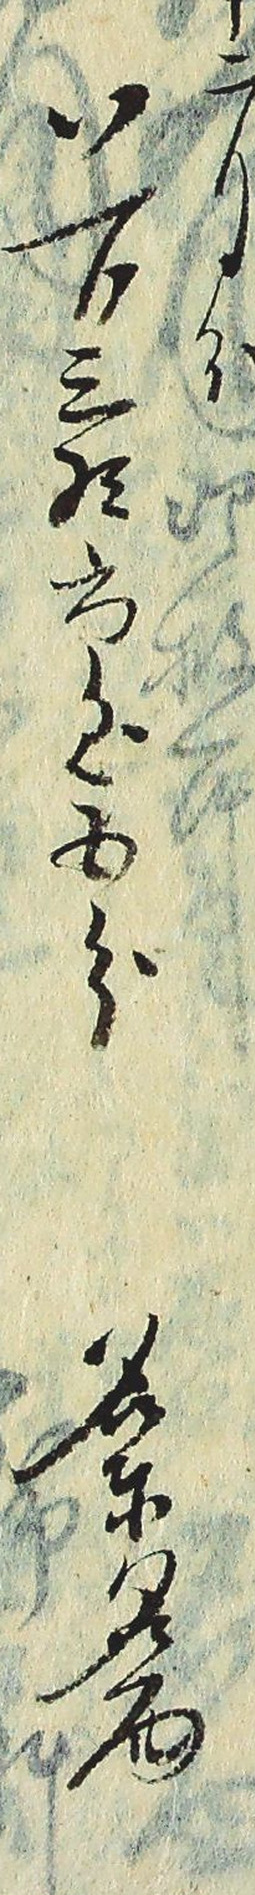同百三拾六匁五分名東名西
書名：名東郡中諸割賦元帳
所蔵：鳴門教育大学 Naruto University of Education
